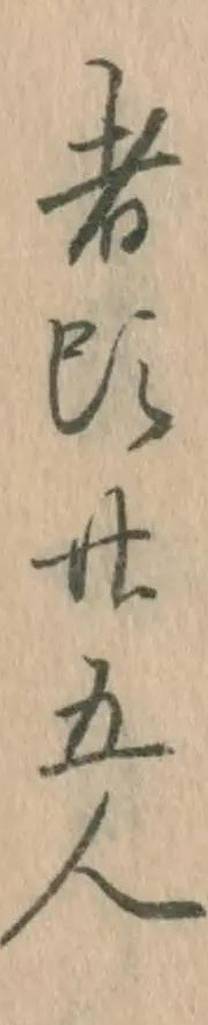者頭廿五人
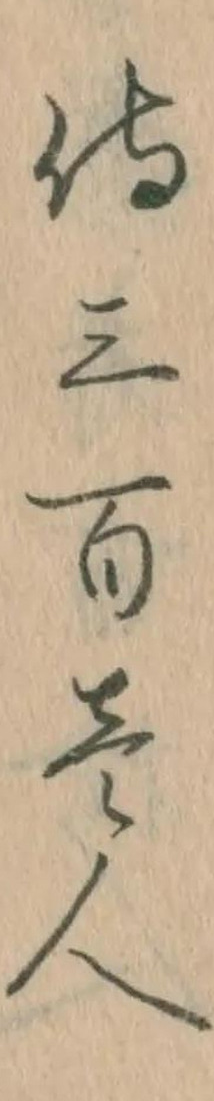侍三百壱人
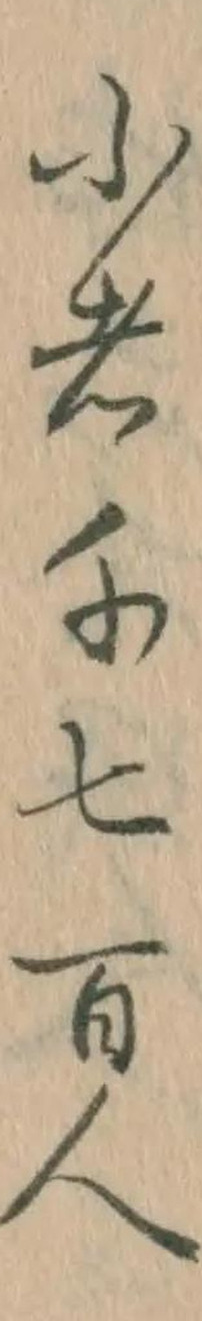小者千七百人
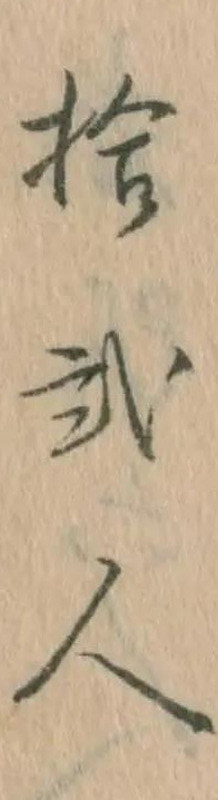拾弐人
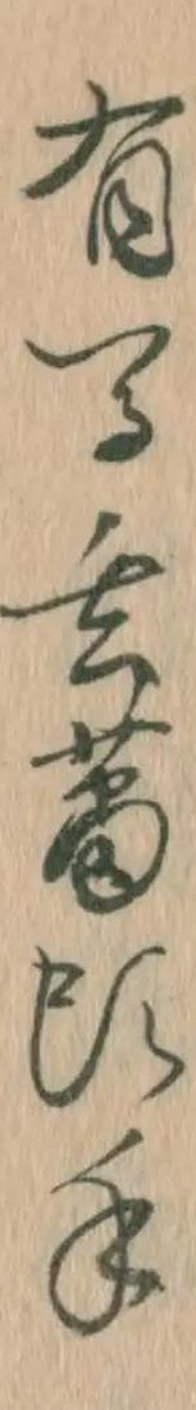有馬玄蕃頭手
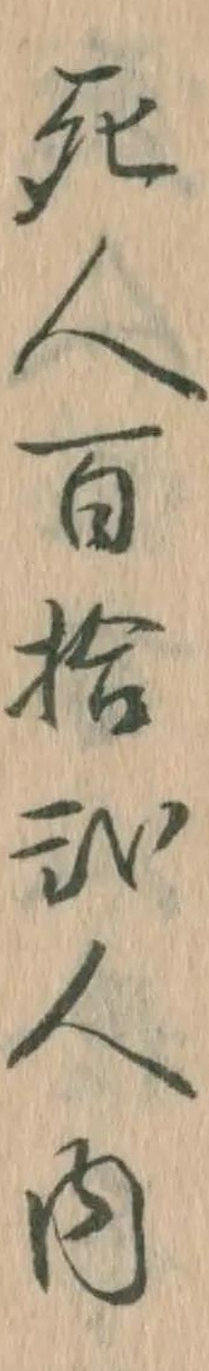死人百拾弐人内
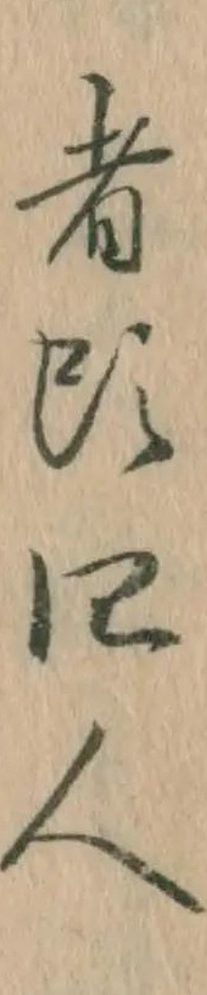者頭四人
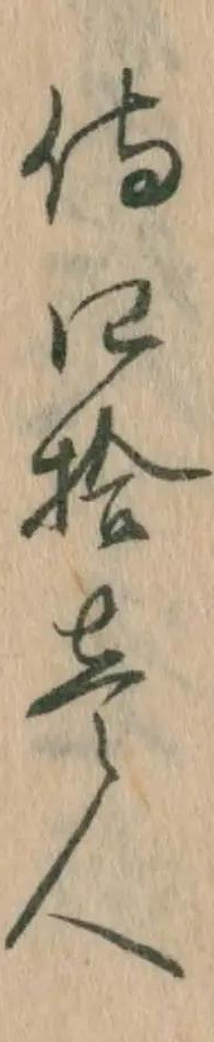侍四拾壱人
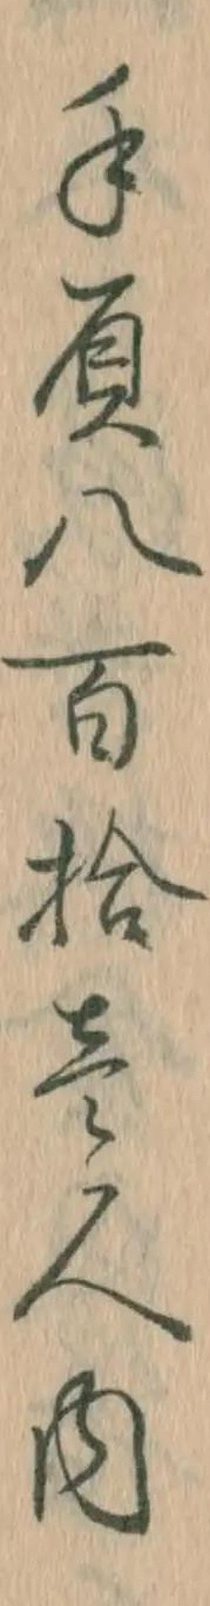手負八百拾壱人内
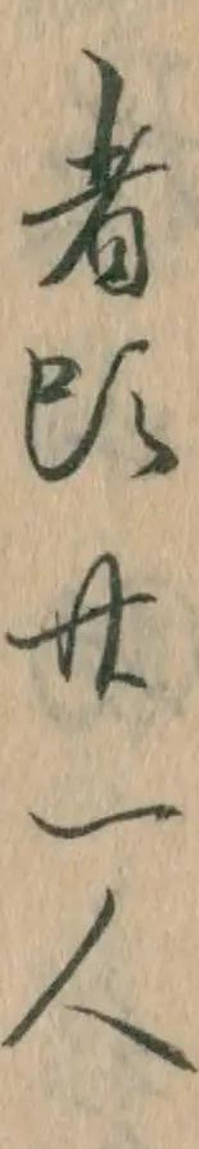者頭廿一人
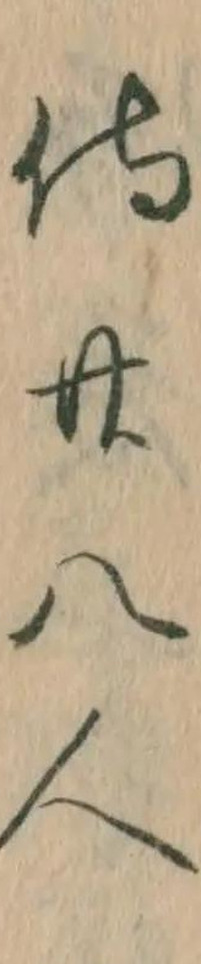侍廿八人
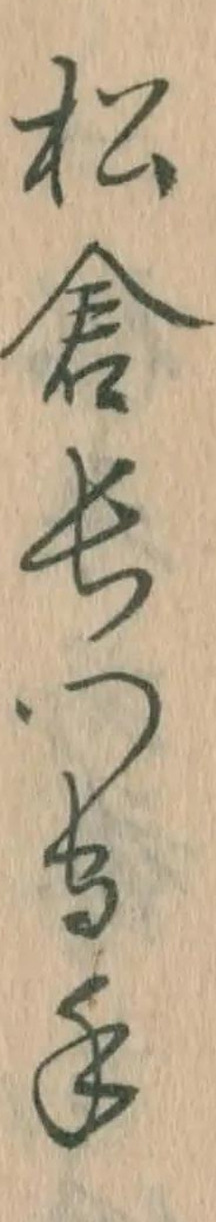松倉長門守手
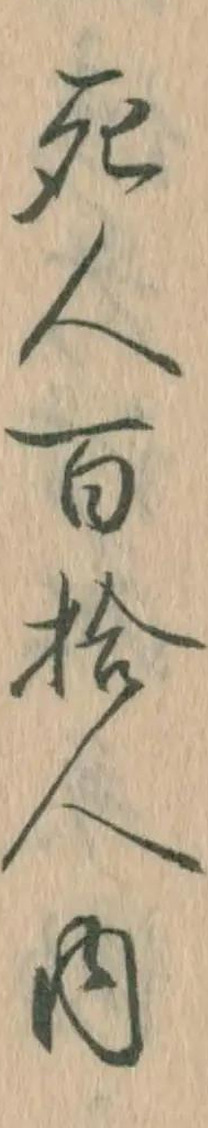死人百拾人内
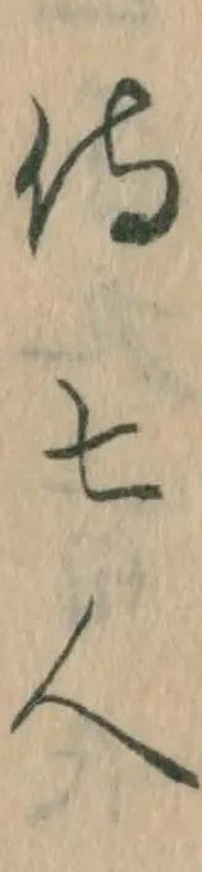侍七人
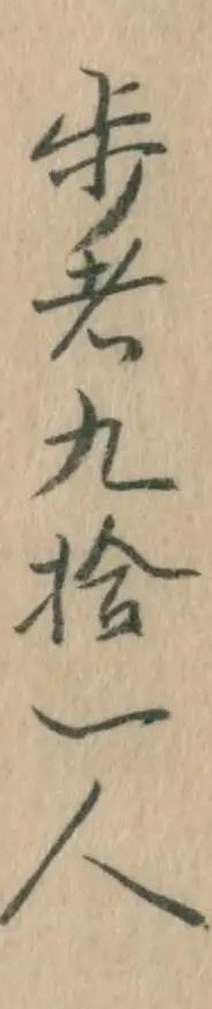歩者九拾一人
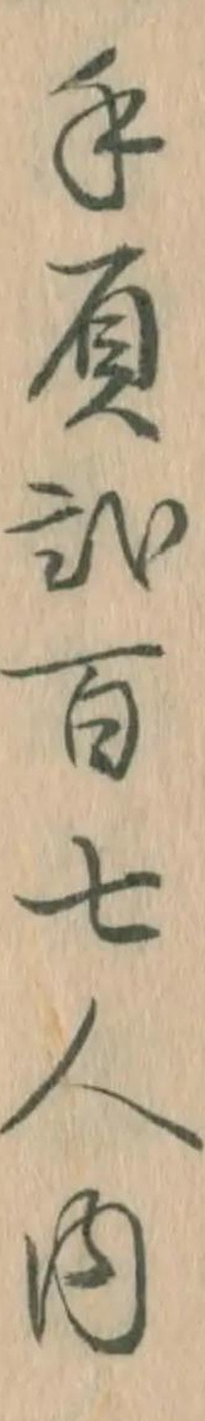手負弐百七人内
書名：切支丹御退治記 49巻. [5]
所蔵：国立国会図書館 National Diet Library, JAPAN
